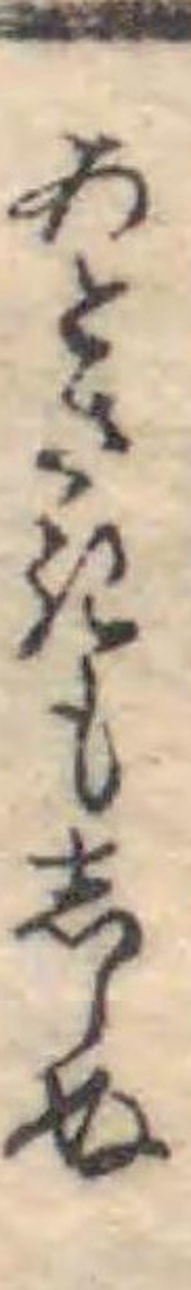あとさきもしらぬ
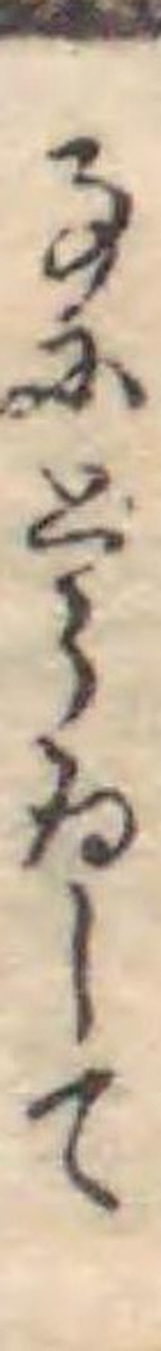事にとうゐして
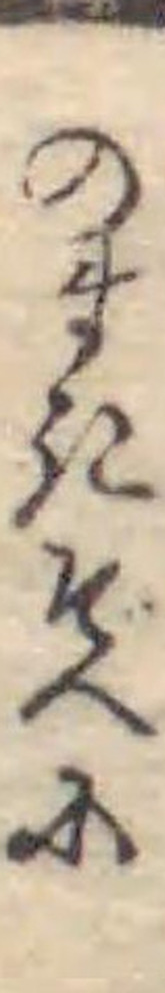のまきぞへに
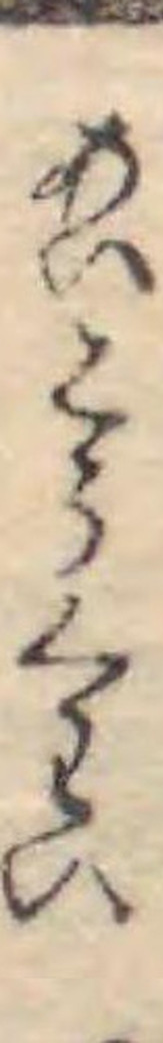あいこうくわい
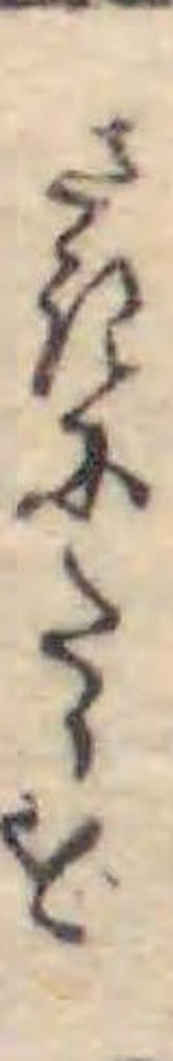さきにたゝず
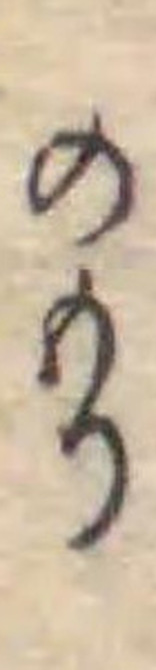のもり

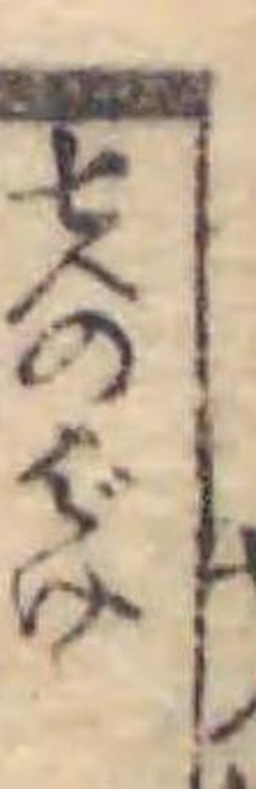七人のばけ
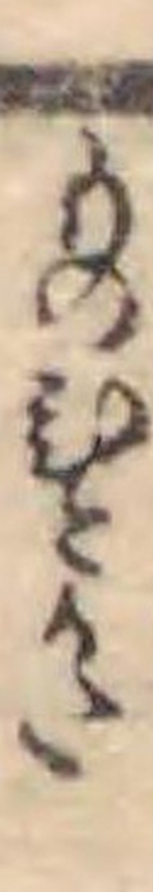ものひとかた
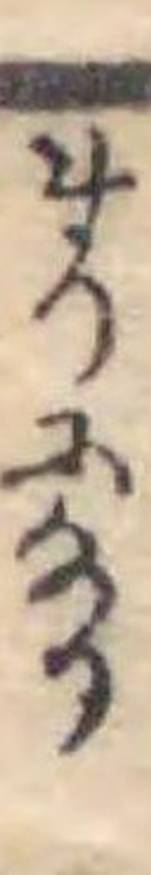まりになり
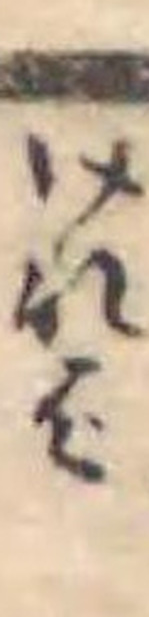ければ
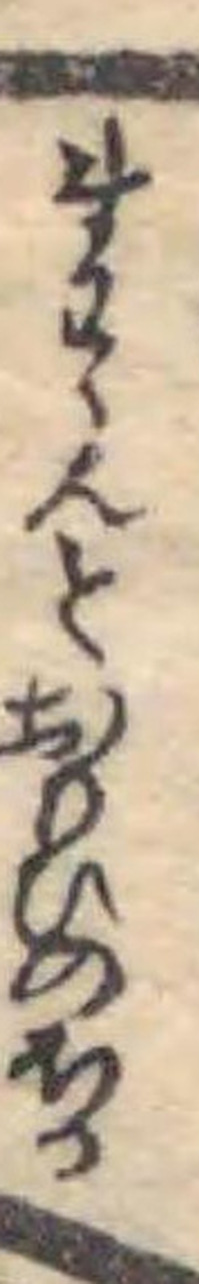まわらんとおもひのほか
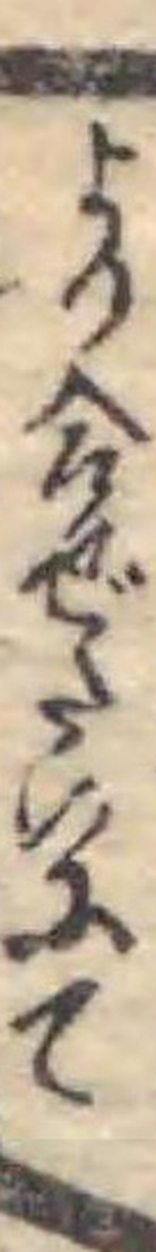より合ぜたいにて
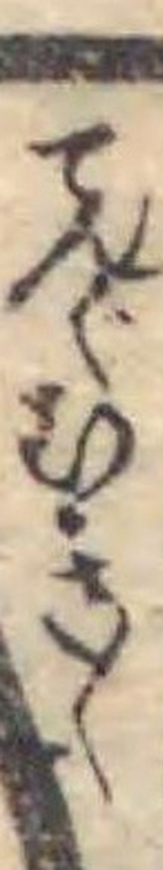てん〴〵むき〳〵
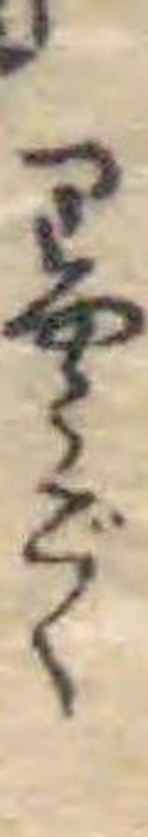りやうごく
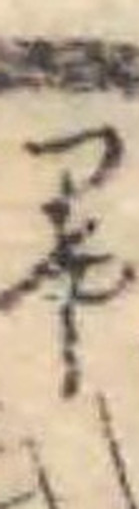りやう
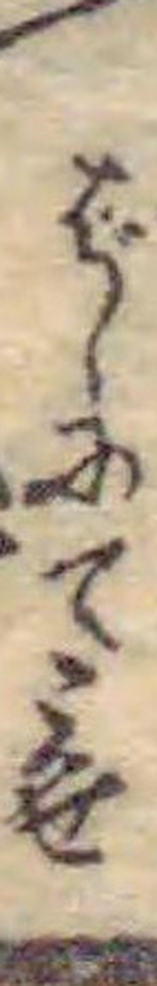ばしにてみせ
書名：鐘入七人化粧 : 3巻
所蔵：国立国会図書館 National Diet Library, JAPAN
